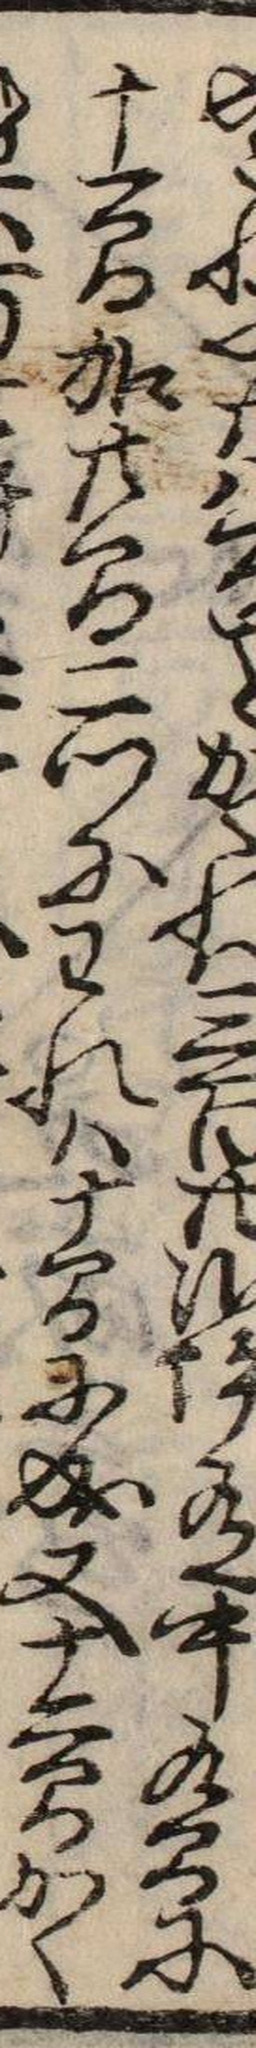十一間加廿間二つにわれは十間に成又十二間かく
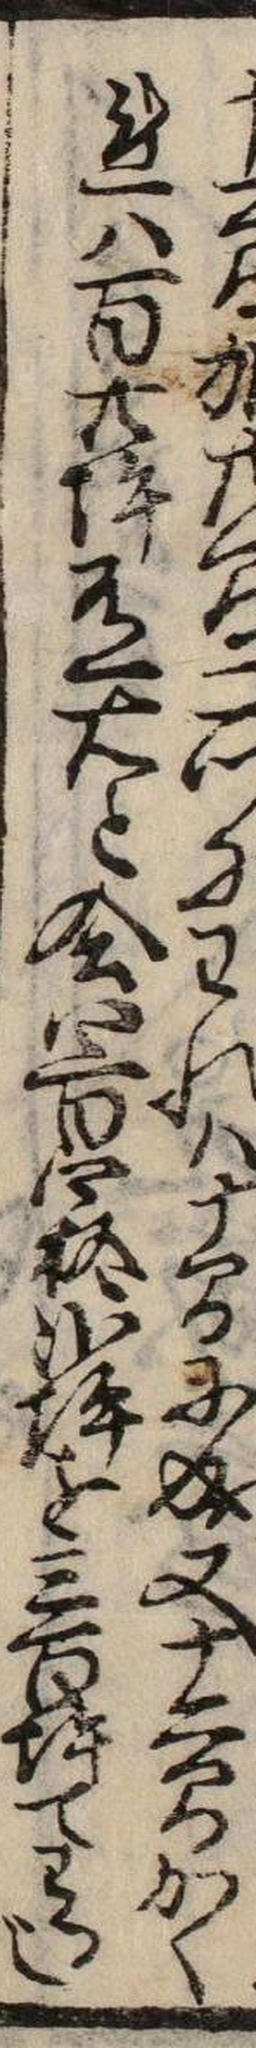れは百廿坪有右と合四百四拾弐坪を三百坪てわる也
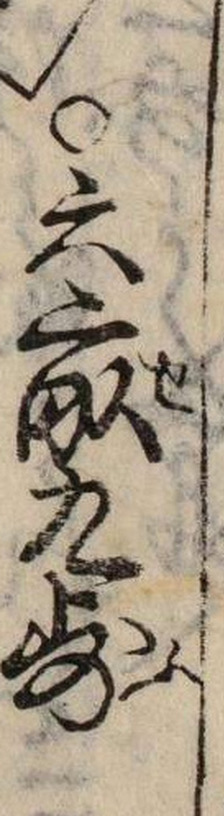○六畝九歩
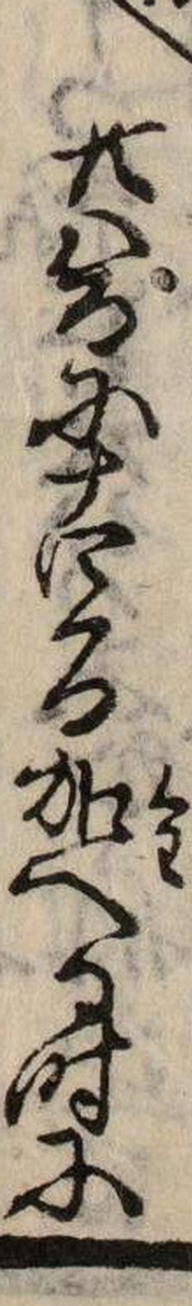廿八間に十四間加へる時に
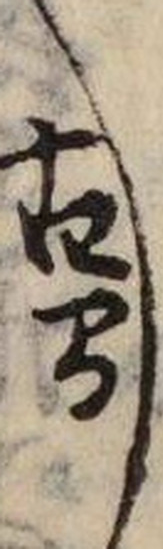十四間
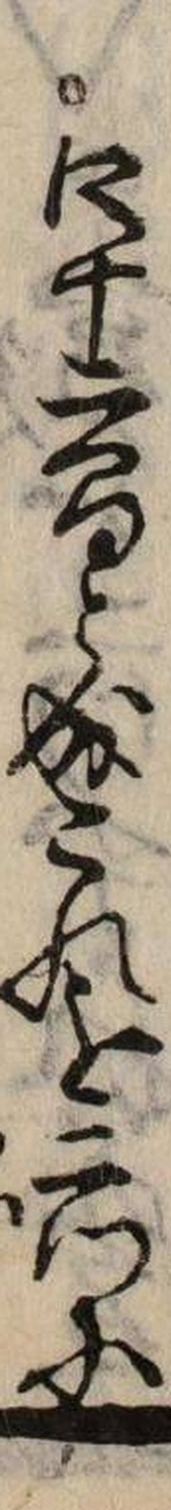四十二間と成これを二つに
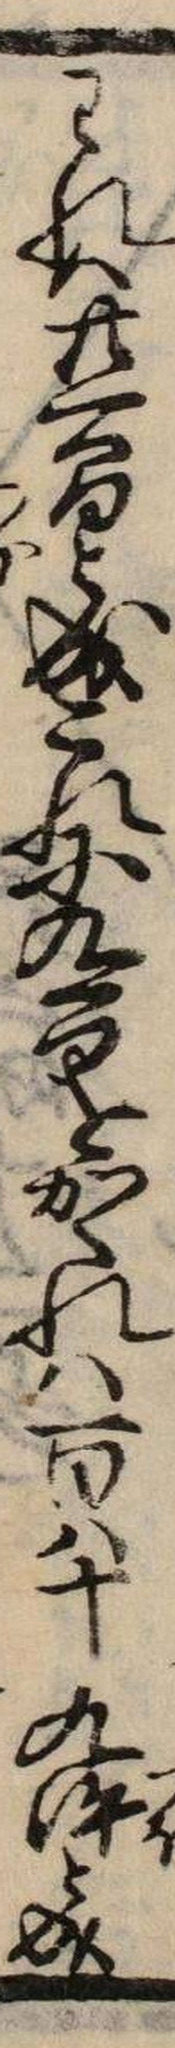われは廿一間と成これに九間をかくれは百八十九坪と成
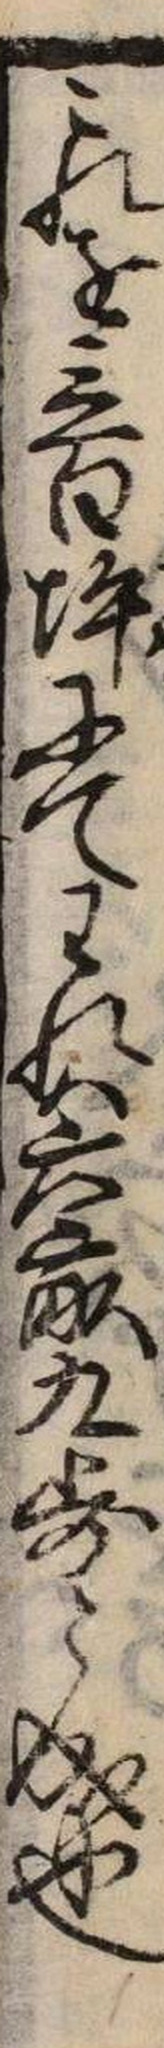これを三百坪にてわれは六畝九歩と成也
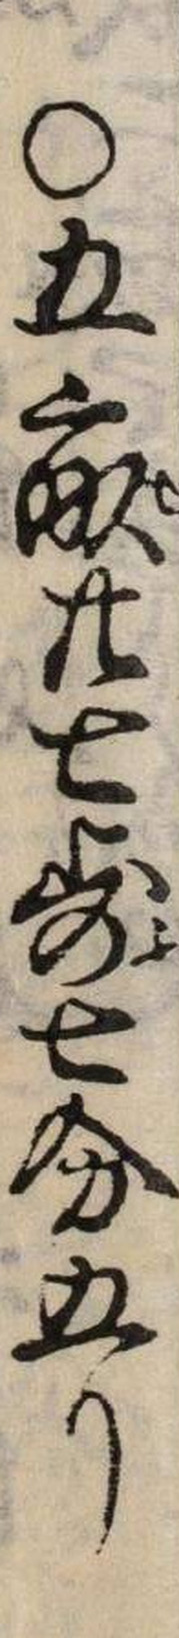○五畝廿七歩七分五り
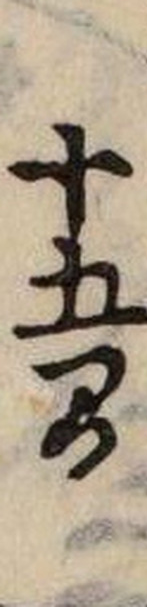十四間
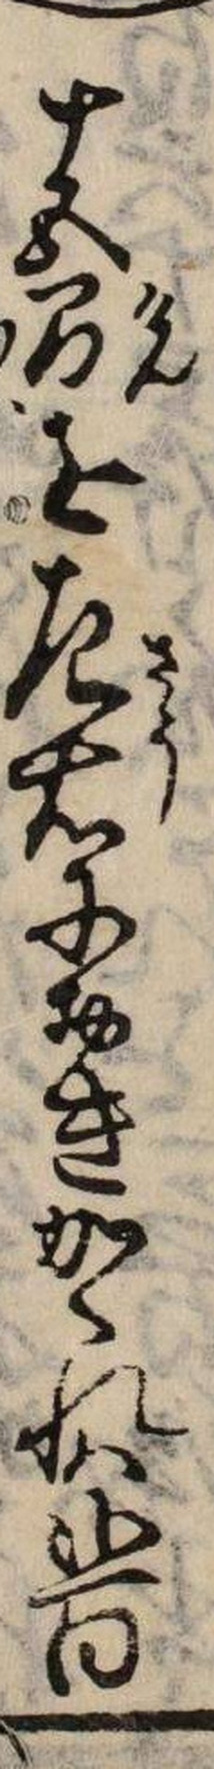十五間を左右におきかくれは弐百
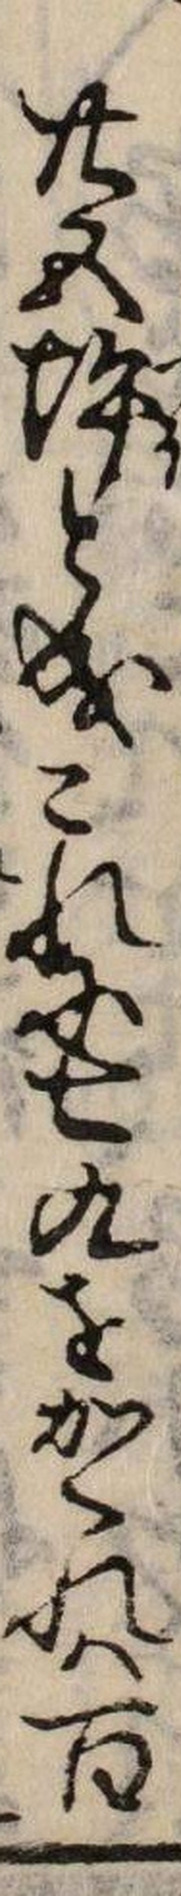廿五坪と成これに七九をかくれは百
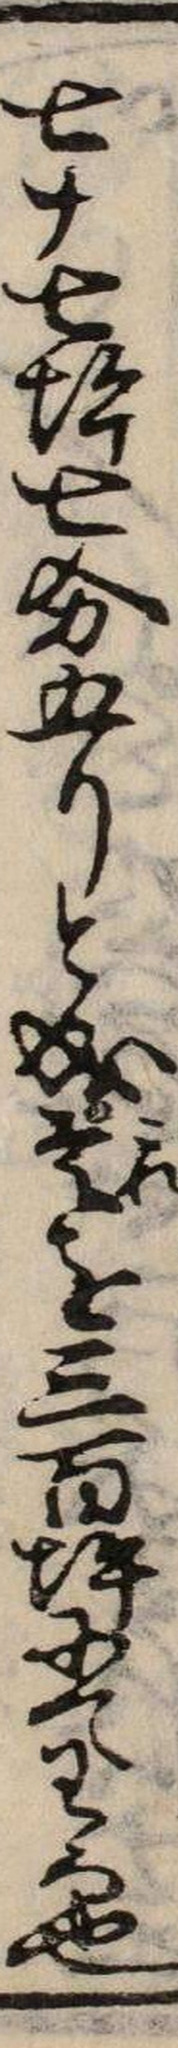七十七坪七分五りと成是を三百坪にてわる也
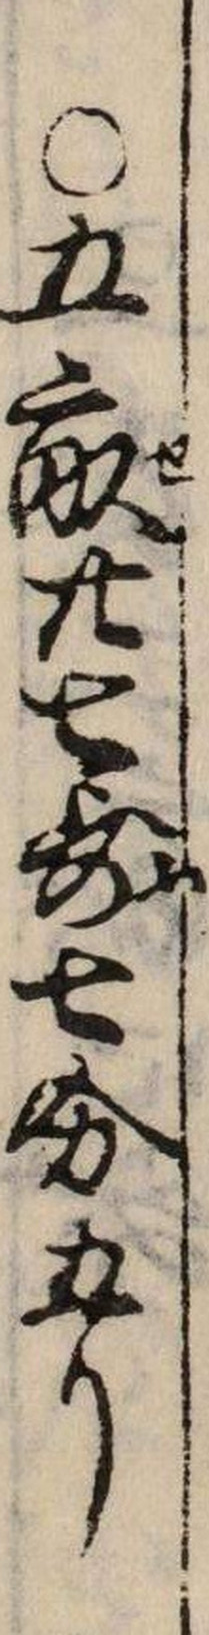○五畝廿七歩七分五り
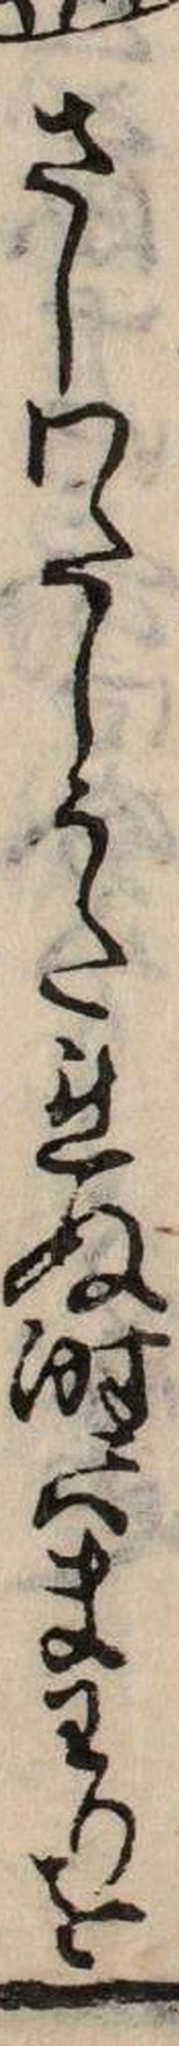さしわたしうたれぬ時にはまわりを
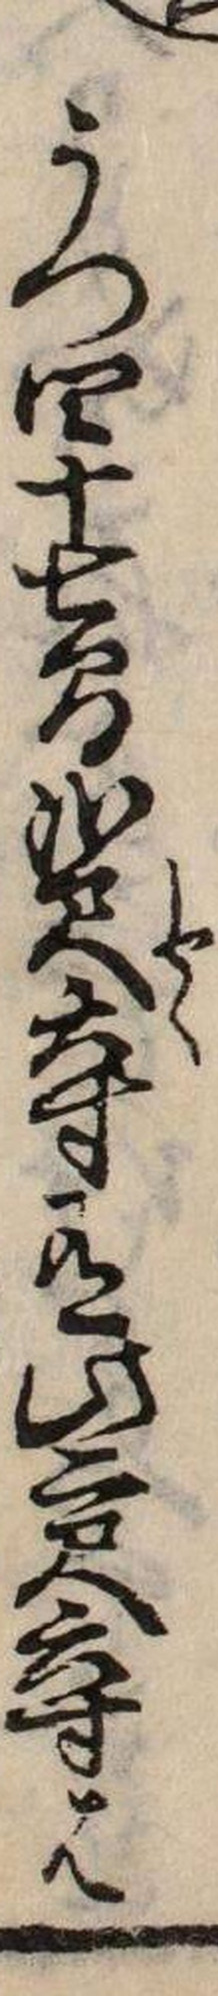うつ四十七間弐尺六寸有此二尺六寸は
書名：塵劫記（寛永11年自跋、京都府立京都学・歴彩館追貴8）
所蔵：京都府立京都学・歴彩館 国文学研究資料館
